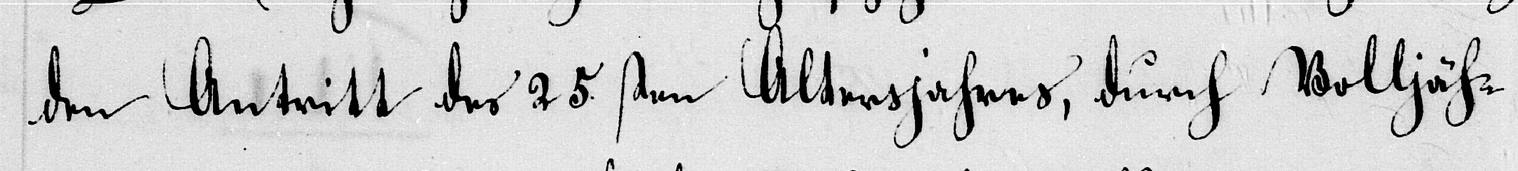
den Antritt des 25.sten Altersjahres, durch Volljäh¬
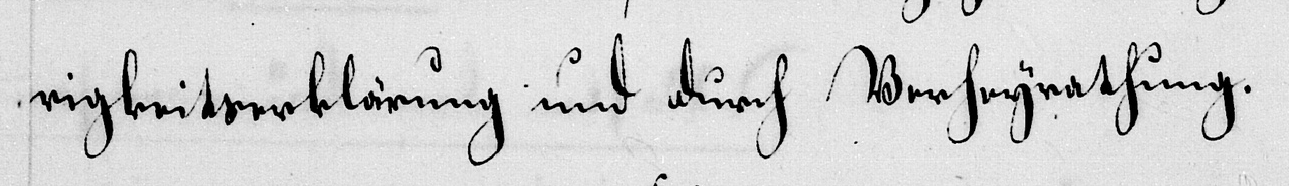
rigkeitserklärung und durch Verheyrathung.
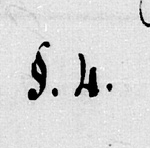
§.4.
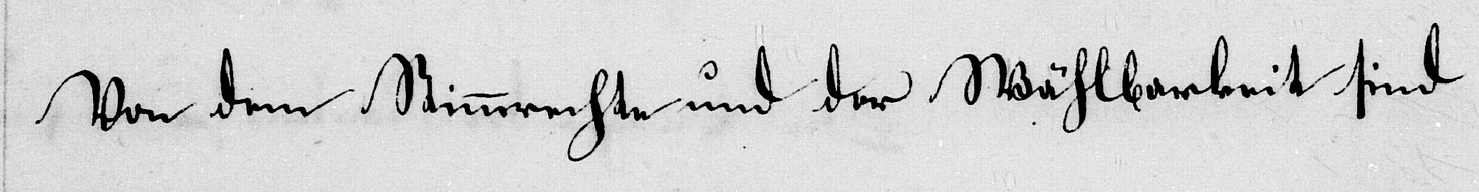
Von dem Stimmrechte und der Wählbarkeit sind
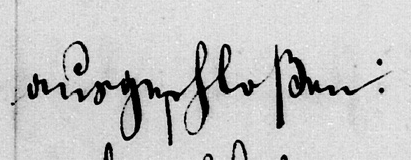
ausgeschloßen:
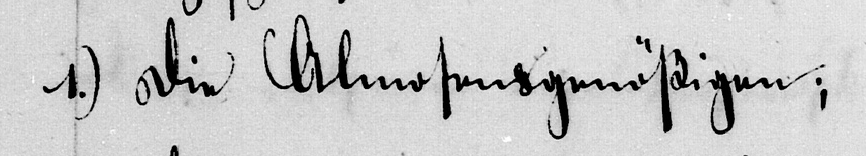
1.) Die Almosensgenößigen;
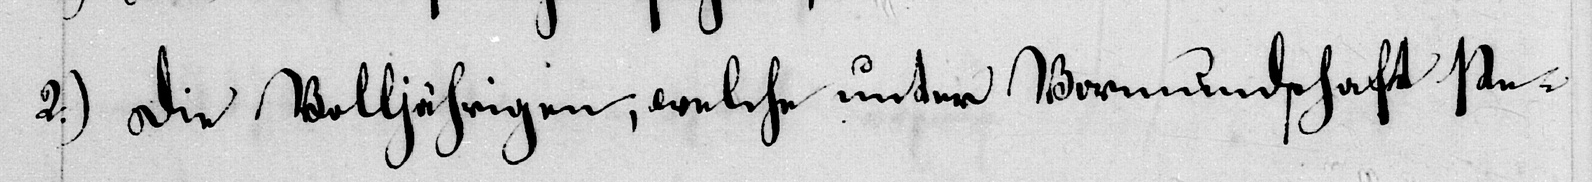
2.) Die Volljährigen, welche unter Vormundschaft ste¬
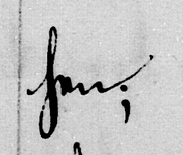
hen;
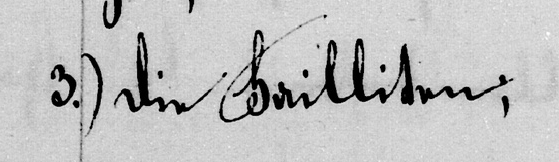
3.) Die Failliten;
